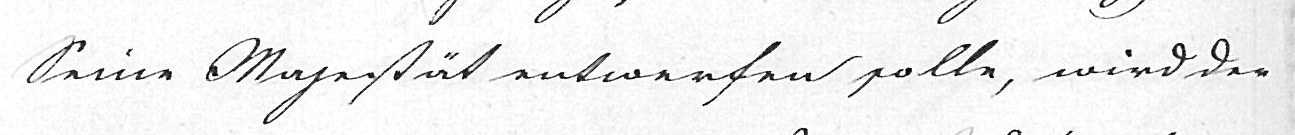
Seine Majestät entwerfen solle, wird der
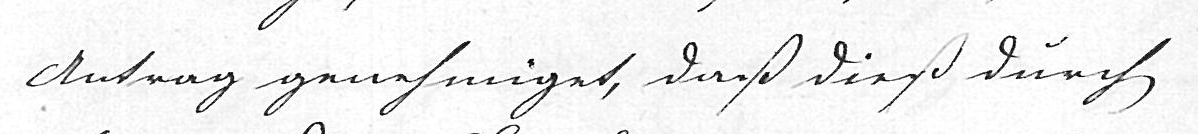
Antrag genehmiget, daß dieß durch
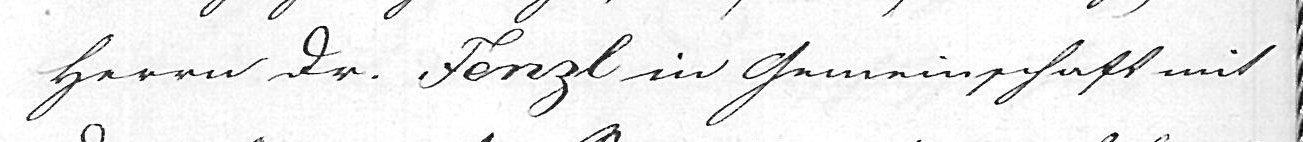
Herrn Dr. Fenzl in Gemeinschaft mit
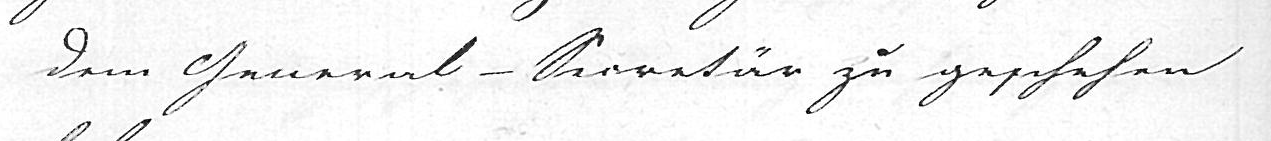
dem General-Secretär zu geschehen
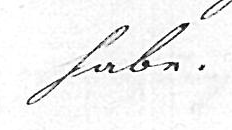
habe.
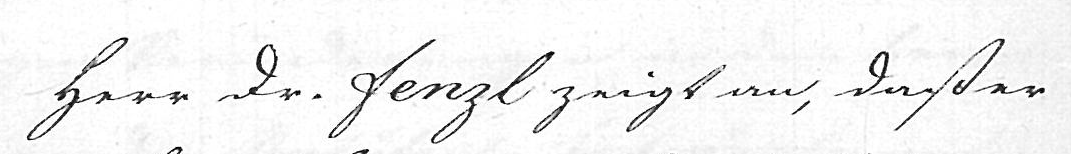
Herr Dr. Fenzl zeigt an daß er
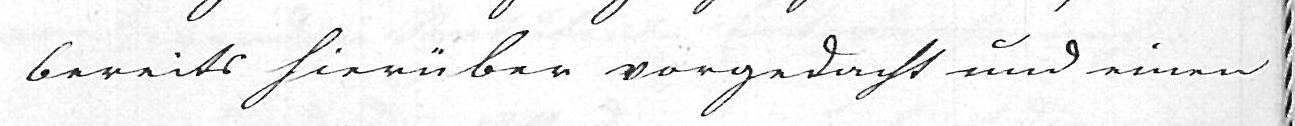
bereits hierüber vorgedacht und einen
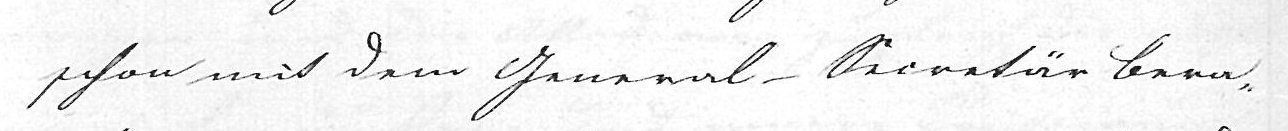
schon mit dem General-Secretär bera-
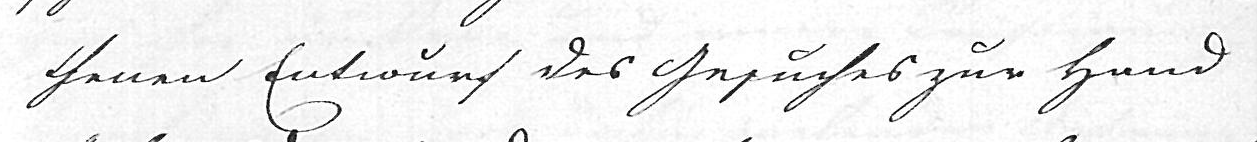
thenen Entwurf des Gesuches zur Hand
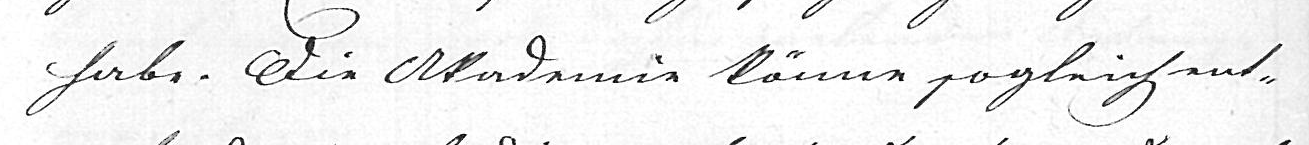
habe. Die Akademie könne sogleich ent-
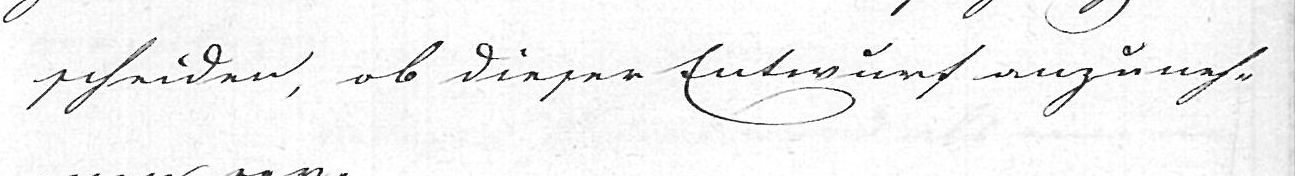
scheiden, ob dieser Entwurf anzuneh-
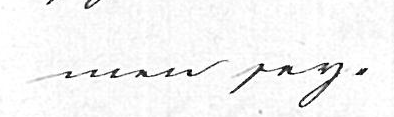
men sey.
